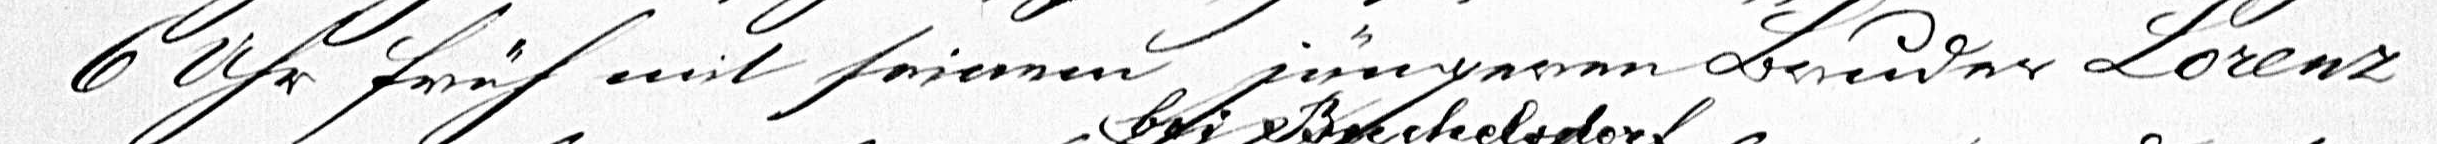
6 Uhr früh mit seinem jüngeren Bruder Lorenz
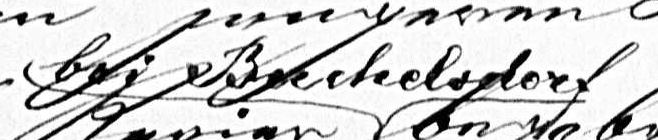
bei Buchelsdorf
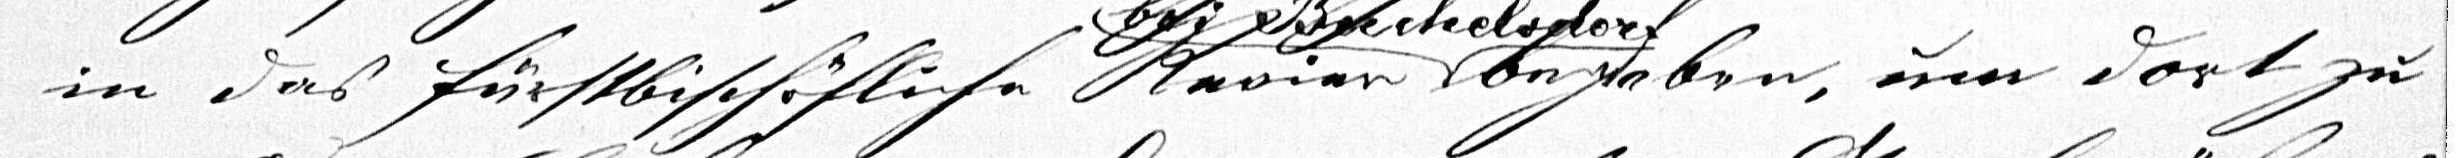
in das fürstbischöfliche Revier begeben, um dort zu
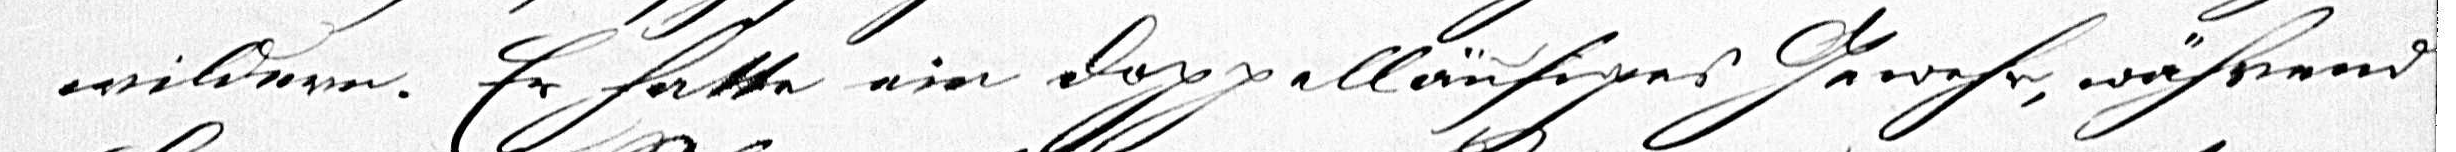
wildere. Er hatte ein Doppelläufiges Gewehr, während
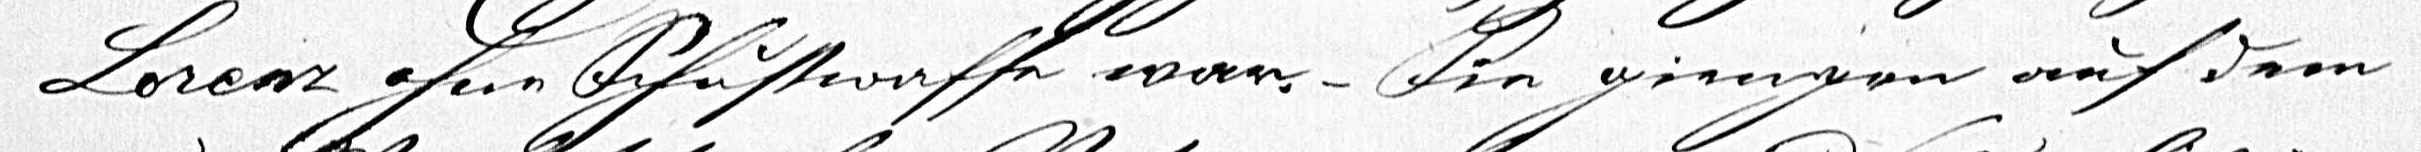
Lorenz ohne Schußwaffe war.- Sie giengen auf dem
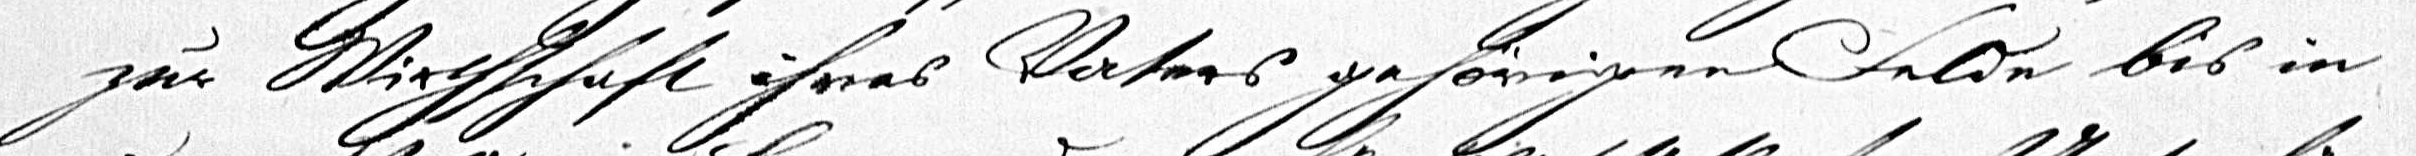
zur Wirthschaft ihres Vaters gehörigen Felde bis in
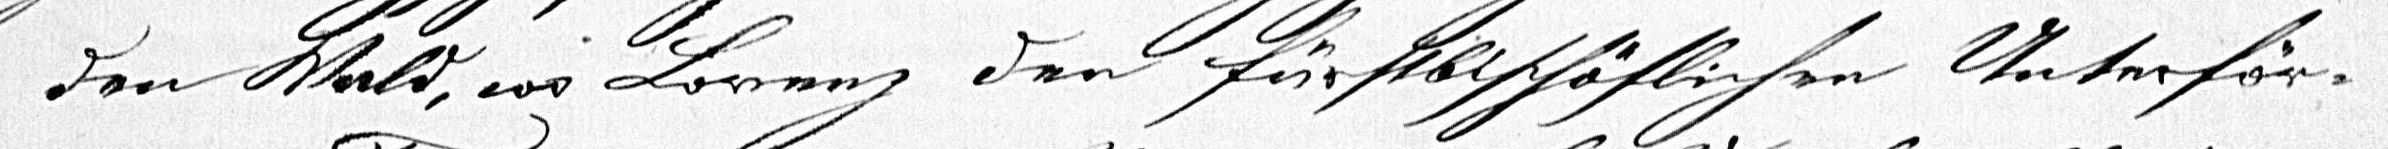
den Wald, wo Lorenz den fürstbischöflichen Unterför¬
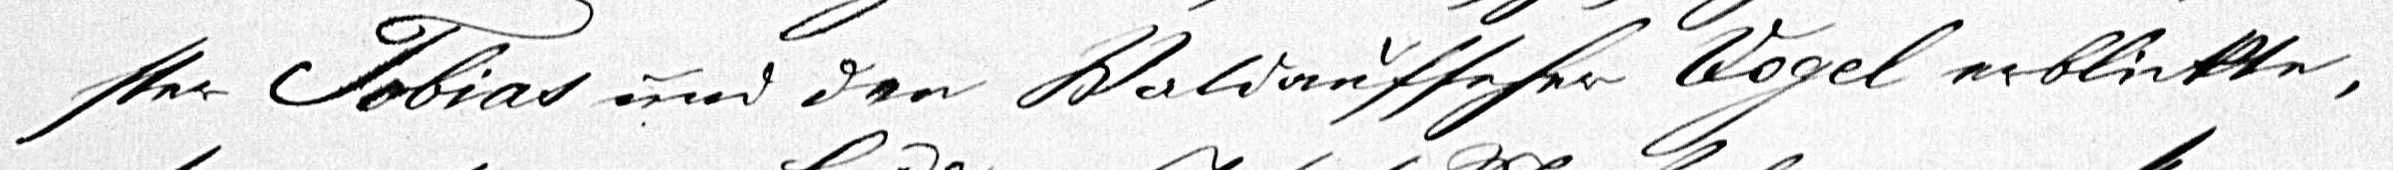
ster Tobias und den Waldaufseher Vogel erblickte,
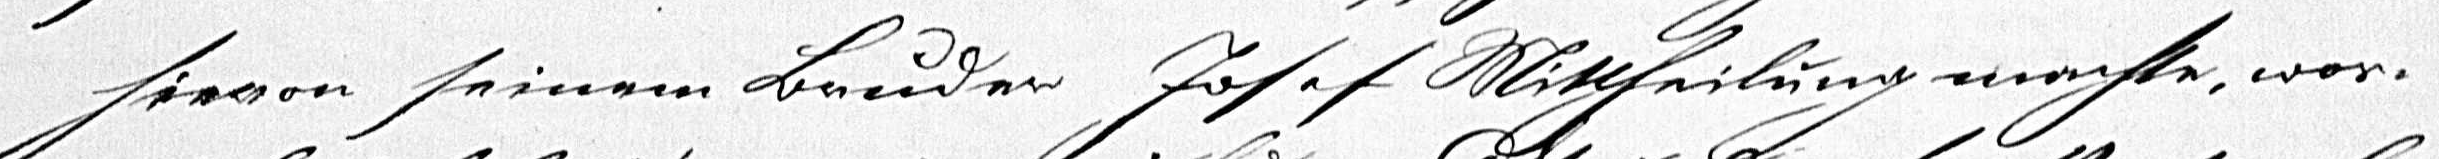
hievon seinem Bruder Josef Mittheilung nachte, wor¬
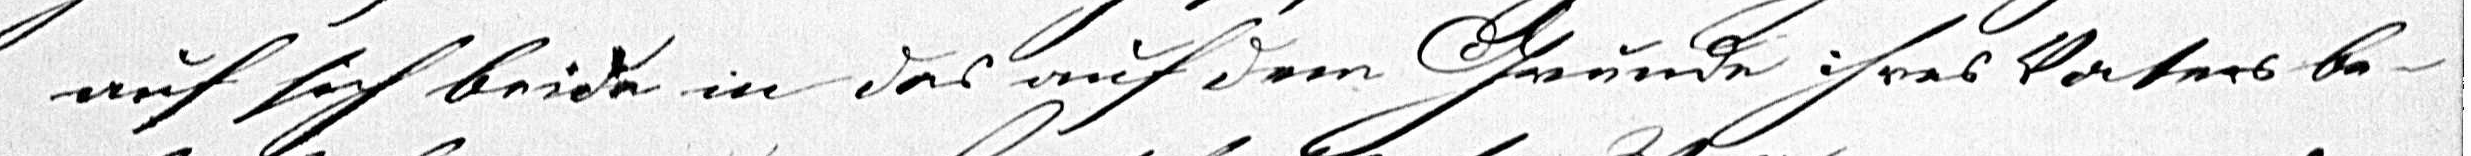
auf sich beide in des auf dem Grunde ihres Vaters be¬
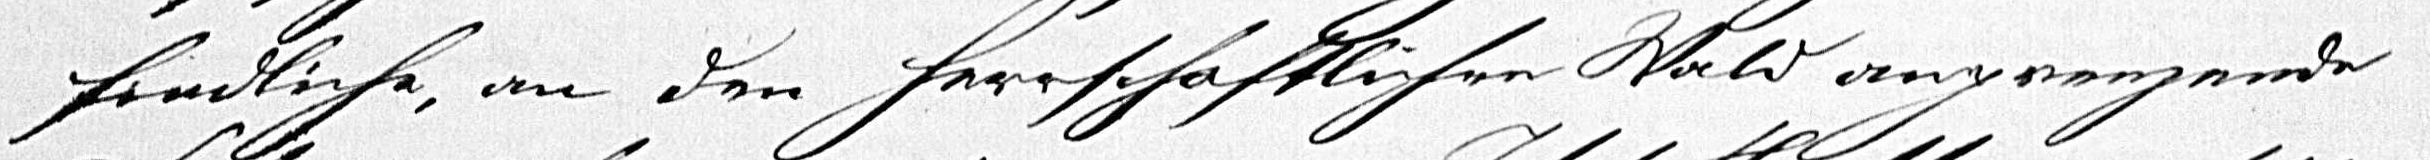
findliche, an den herrschaftlichen Wald angrenzende
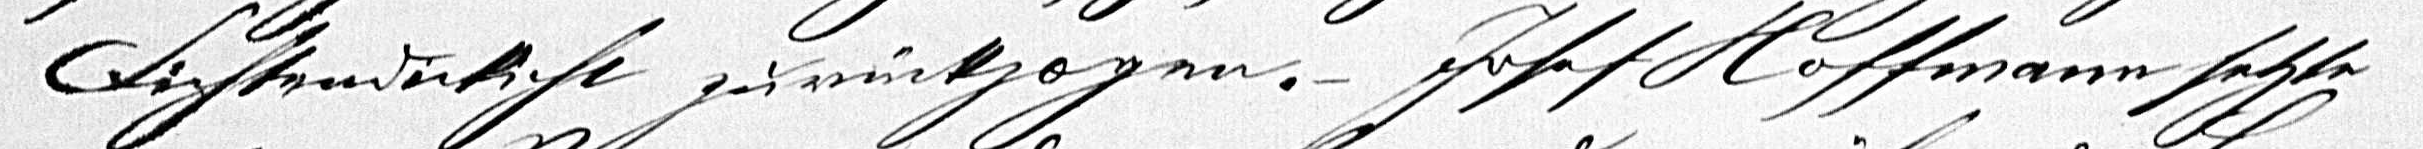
Fichtendxx zurückzogen.- Josef Hoffmann setzte
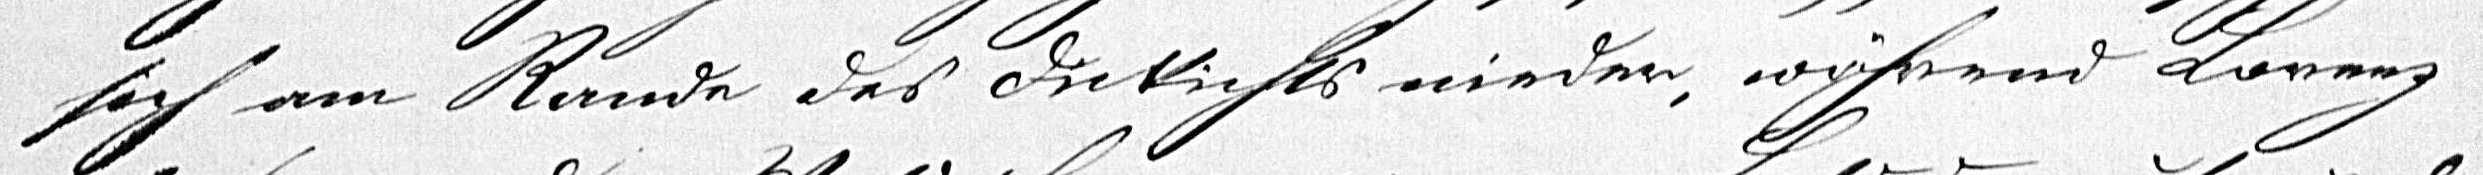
sich am Rande des Dickichts nieder, während Lorenz
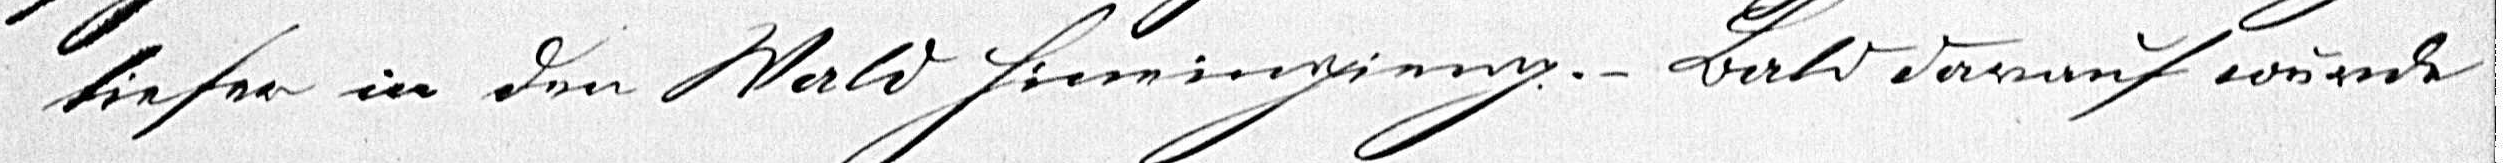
tiefer in den Wald hineingieng.- Bald darauf wurde
